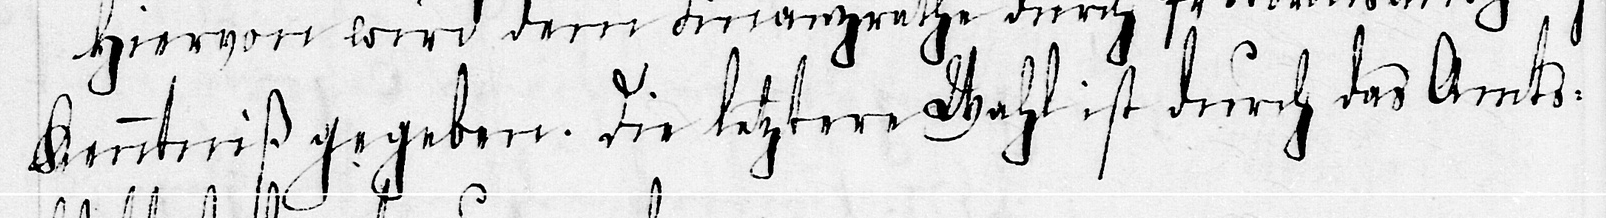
Kenntniß gegeben. Die letztere Wahl ist durch das Amts¬
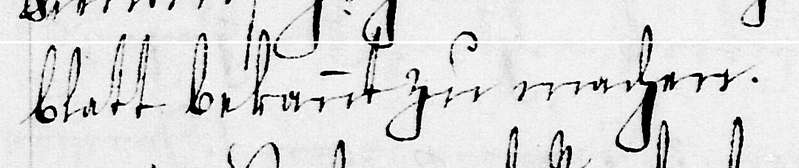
blatt bekannt zu machen.
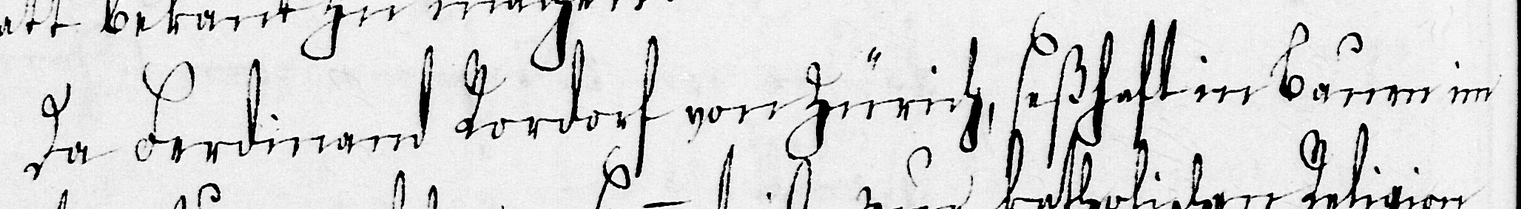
Da Ferdinand Rordorf von Zürich, seßhaft in Bauen
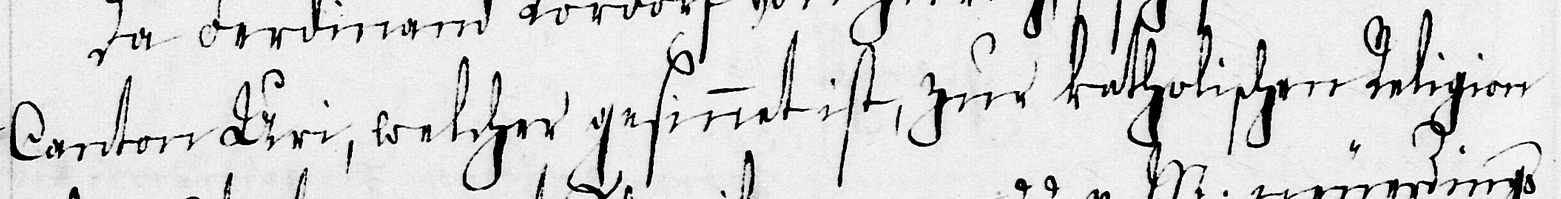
Canton Uri, welcher gesinnet ist, zur katholischen Religion
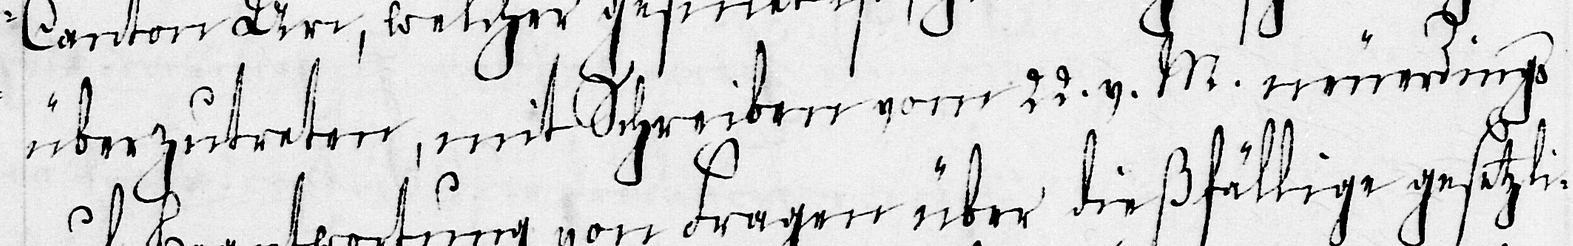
überzutreten, mit Schreiben vom 22. v. M. neuerdings
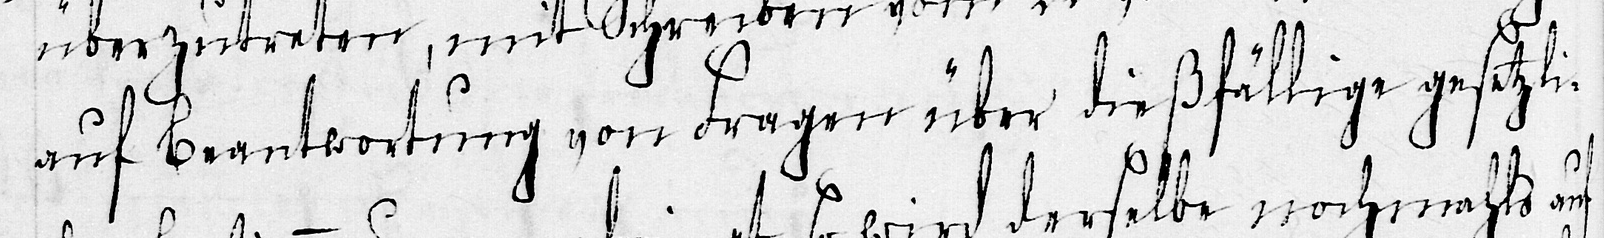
auf Beantwortung von Fragen über dießfällige gesetzli¬
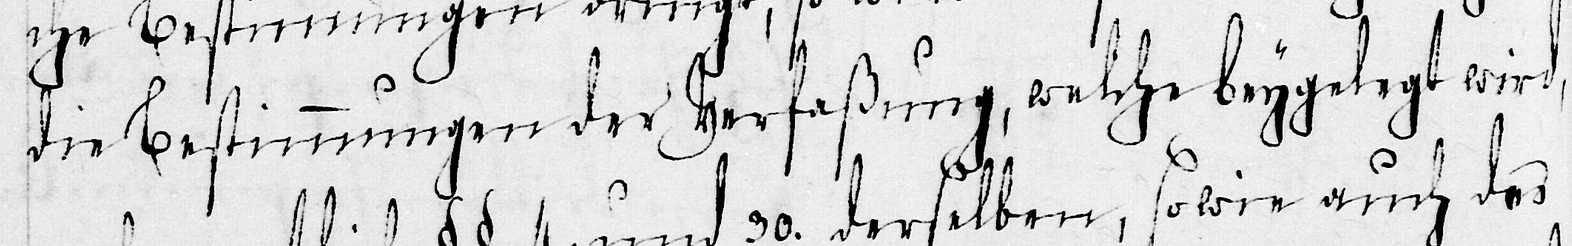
die Bestimmungen der Verfaßung, welche beygelegt wird,
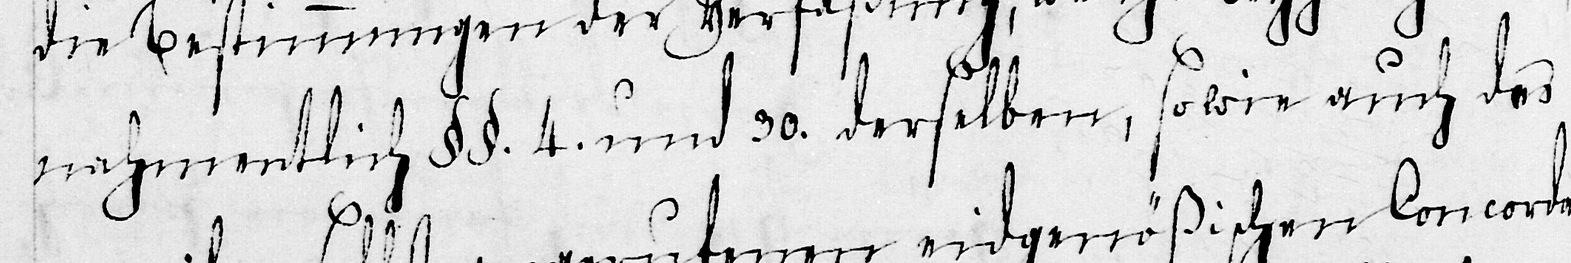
nahmentlich §§. 4. und 30. derselben, sowie auch des
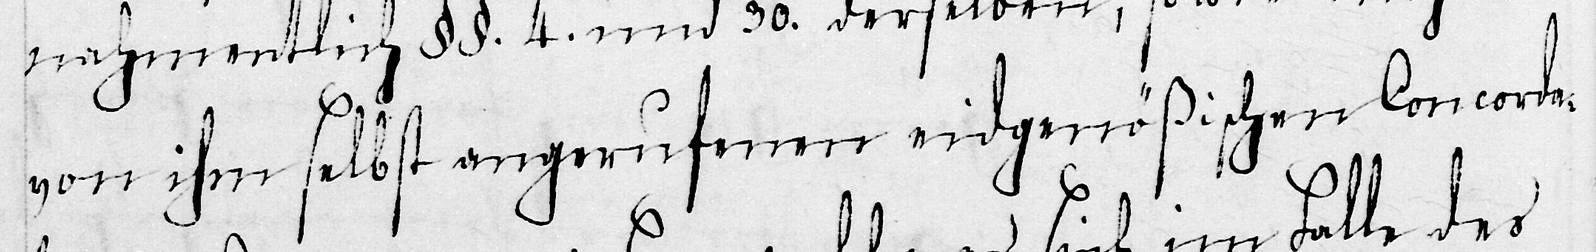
von ihm selbst angerufenen eidgenößischen Concorda¬
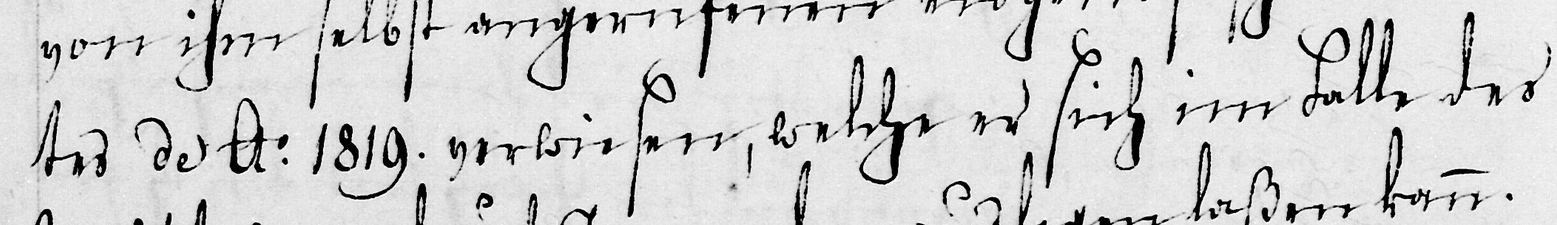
tes de Ao. 1819. verwiesen, welche er sich im Falle des
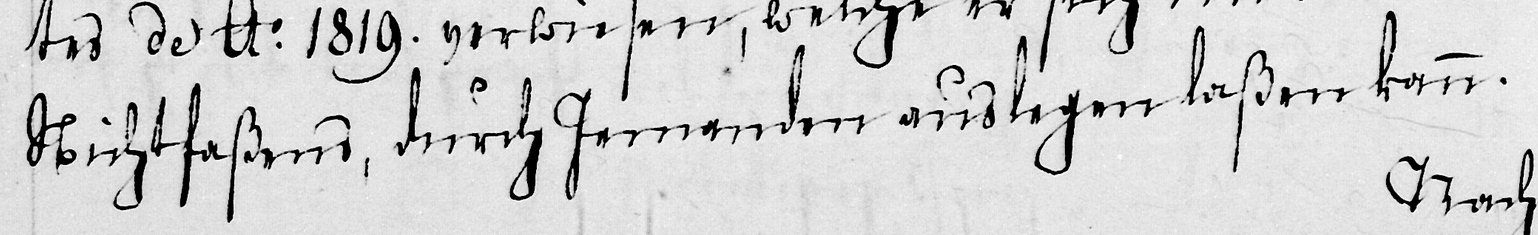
Nichtfaßens, durch Jemanden auslegen laßen kann.
